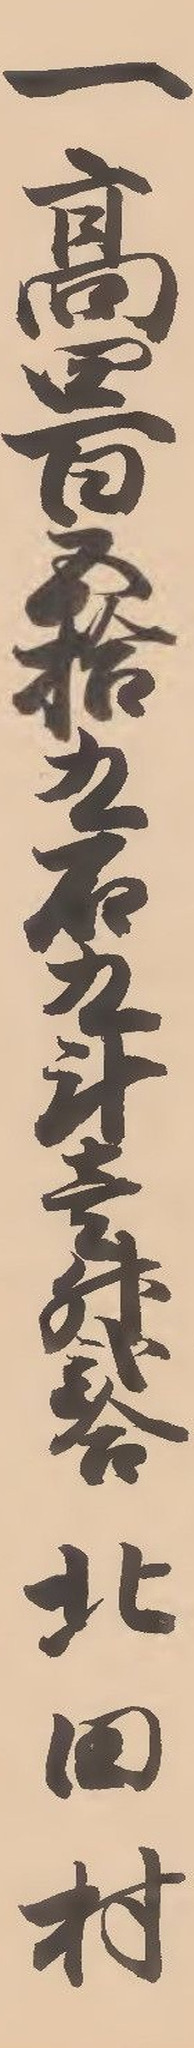一高四百五拾九石九斗壱升弐合北田村
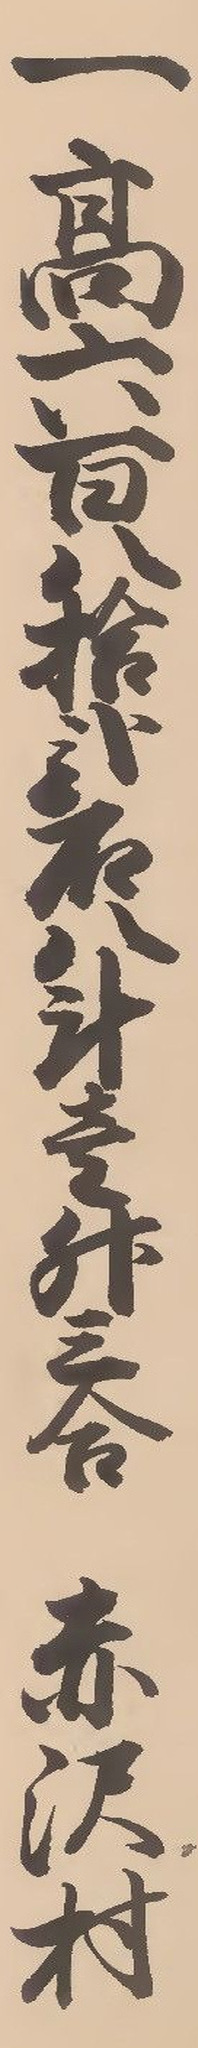一高六百八拾弐石八斗壱升三合赤沢村
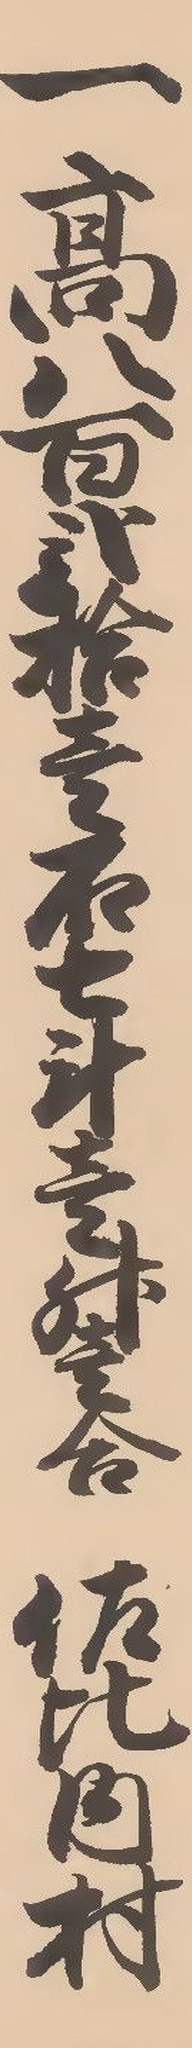一高八百弐拾壱石七斗壱升壱合佐比内村
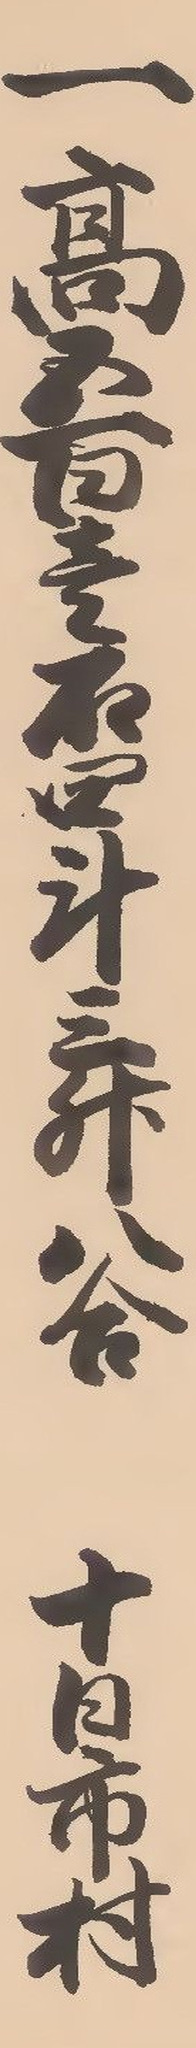一高五百壱石四斗三升八合十日市村
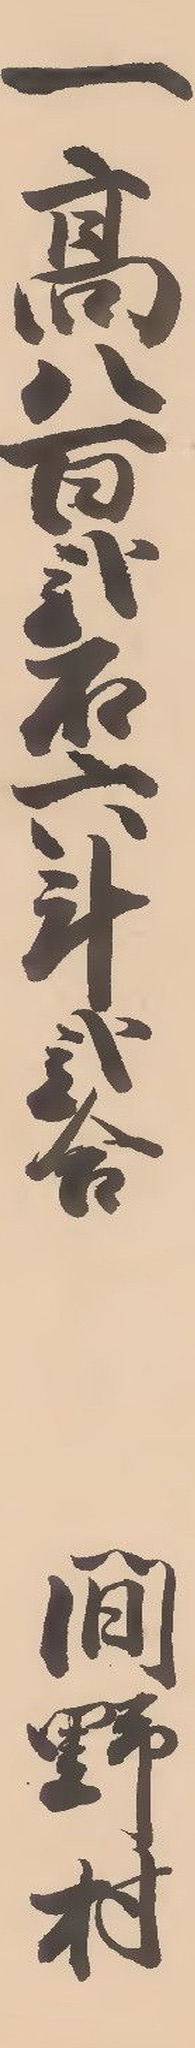一高八百弐石六斗弐合間野村

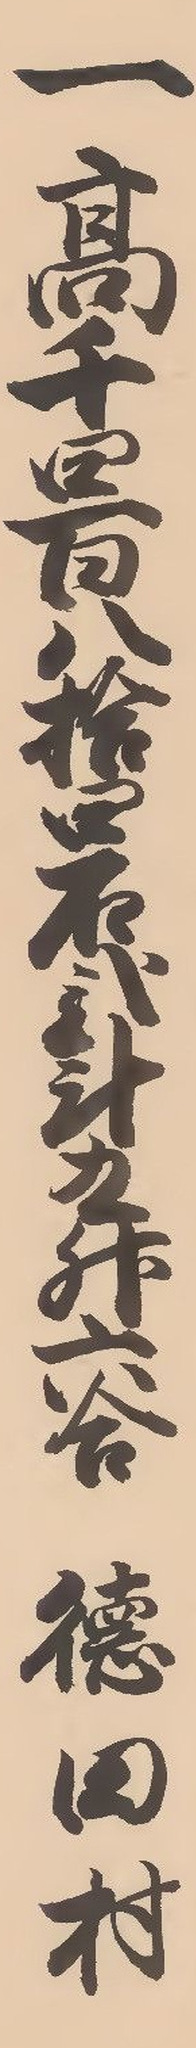一高千四百八拾四石弐斗九升六合徳田村
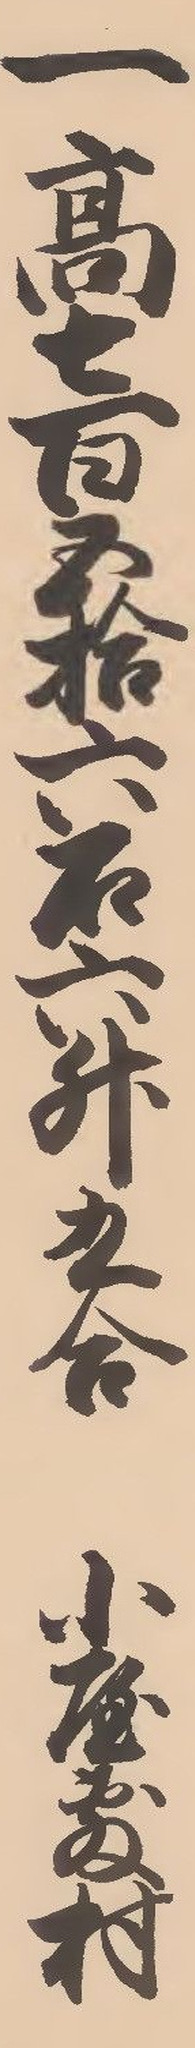一高七百五拾六石六升九合小屋敷村
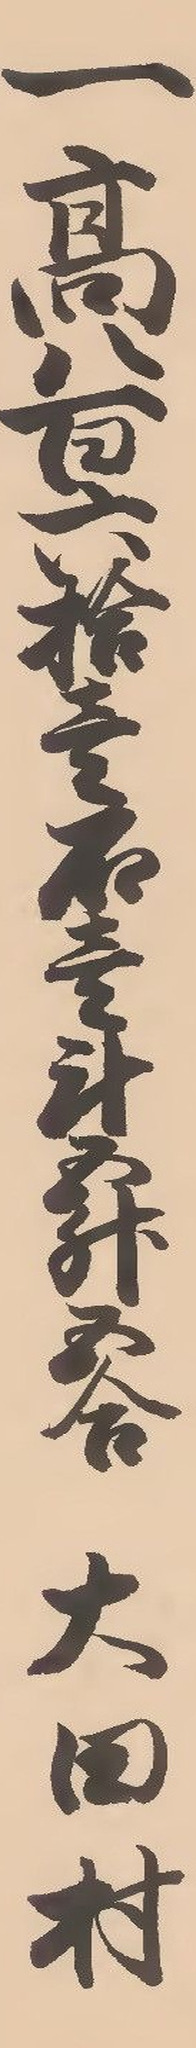一高八百六拾壱石壱斗五升五合大田村
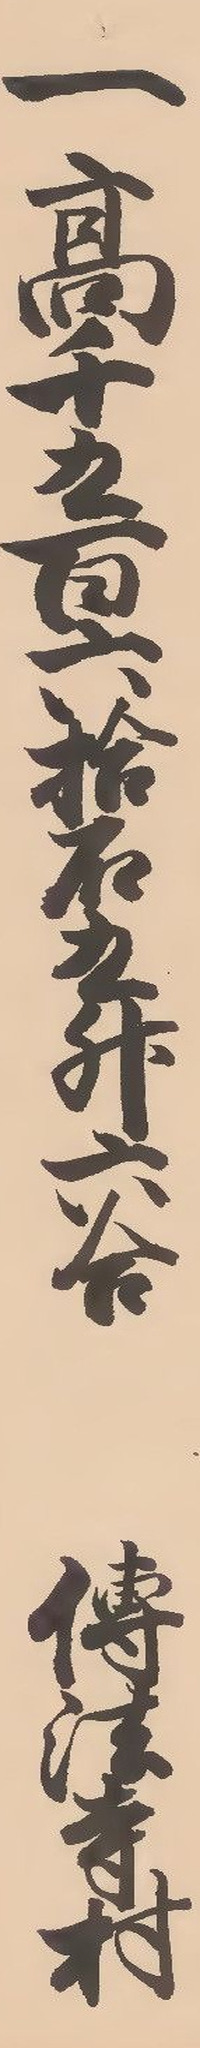一高千九百六拾石九升六合伝法寺村
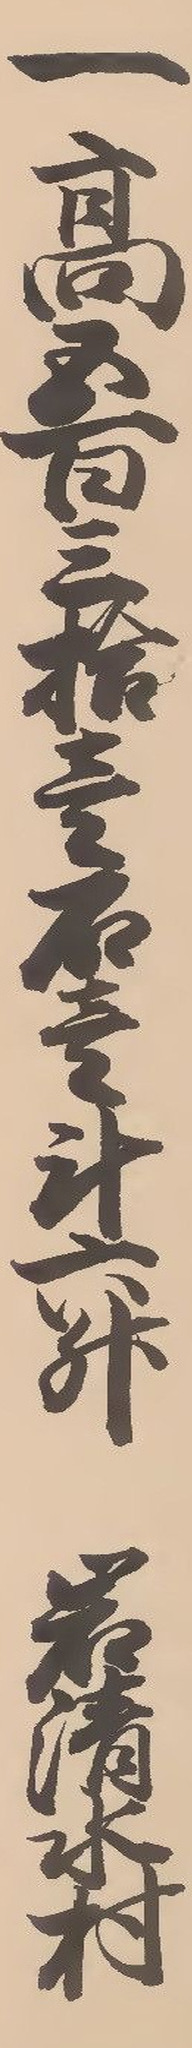一高五百三拾壱石壱斗六升岩清水村
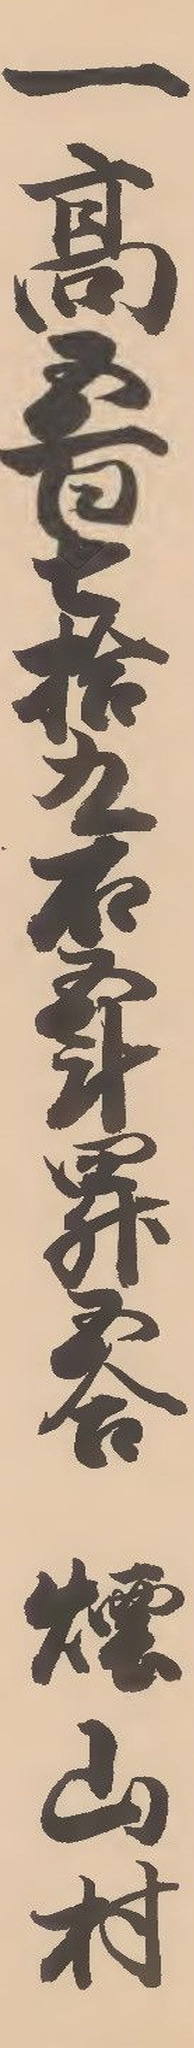一高五百七拾九石五斗四升五合煙山村
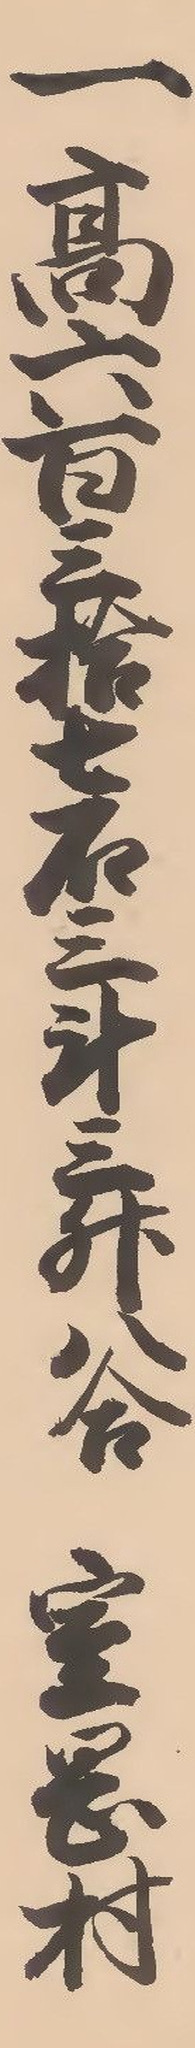一高六百三拾七石三斗三升八合室岡村
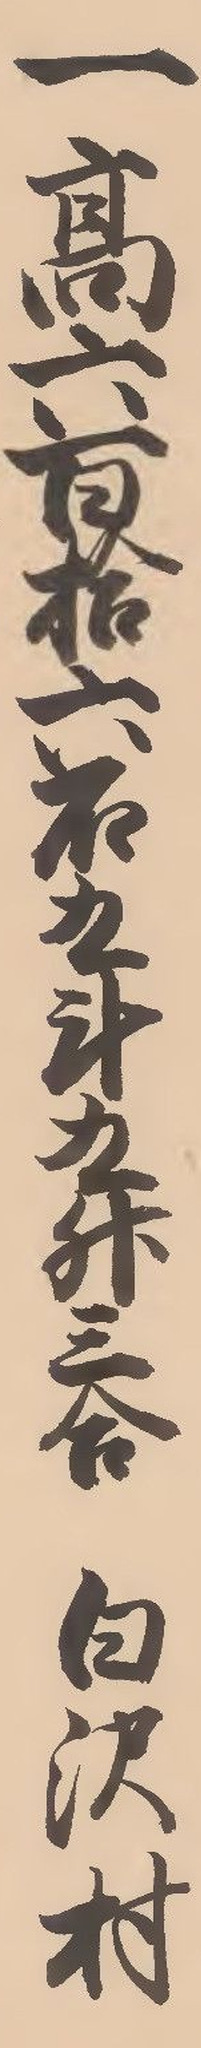一高六百拾六石九斗九升三合白沢村

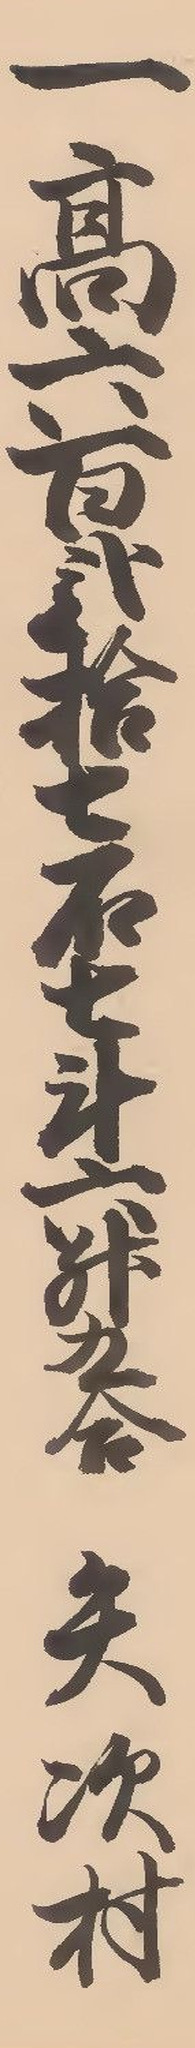一高六百弐拾七石七斗六升九合矢次村
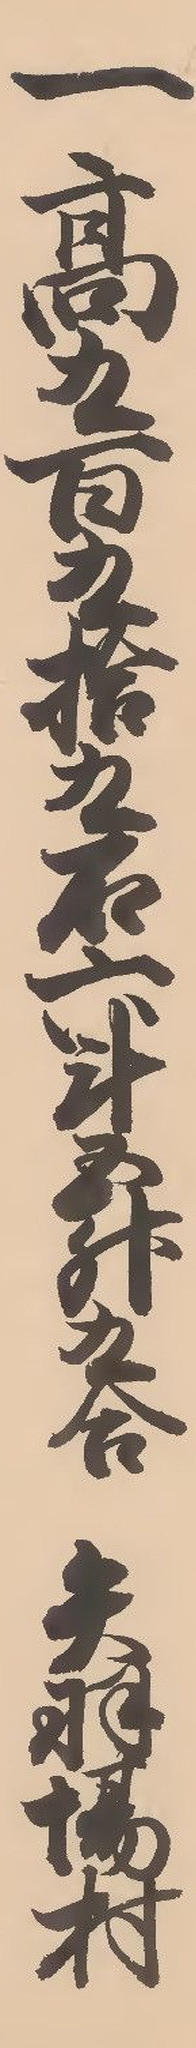一高九百九拾九石六斗五升九合矢羽場村
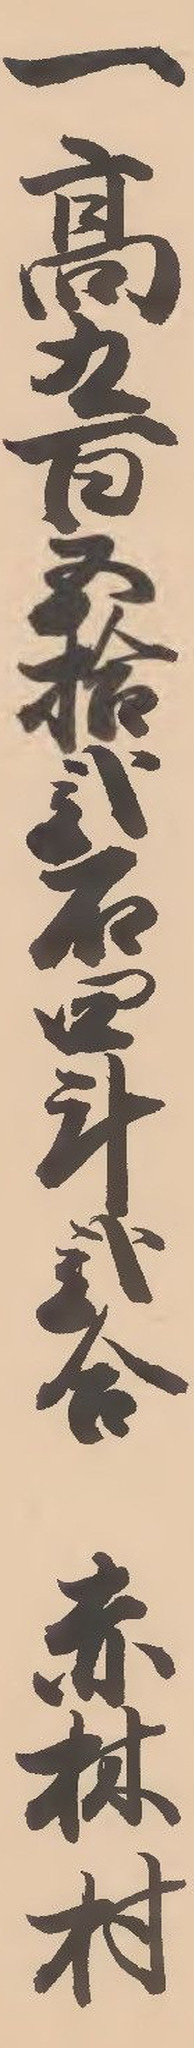一高九百五拾弐石四斗弐合赤林村
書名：陸奥国郷帳　６
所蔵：国立公文書館 National Archives of Japan
